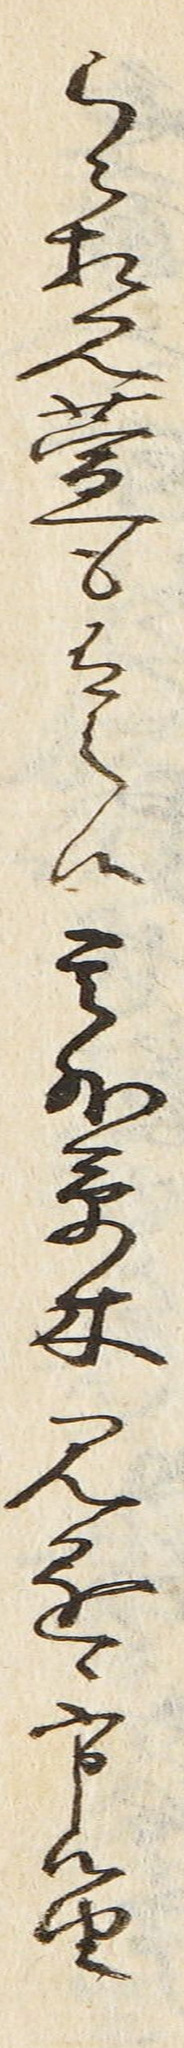らに相見萱も有之候其外草木見懸不申候由
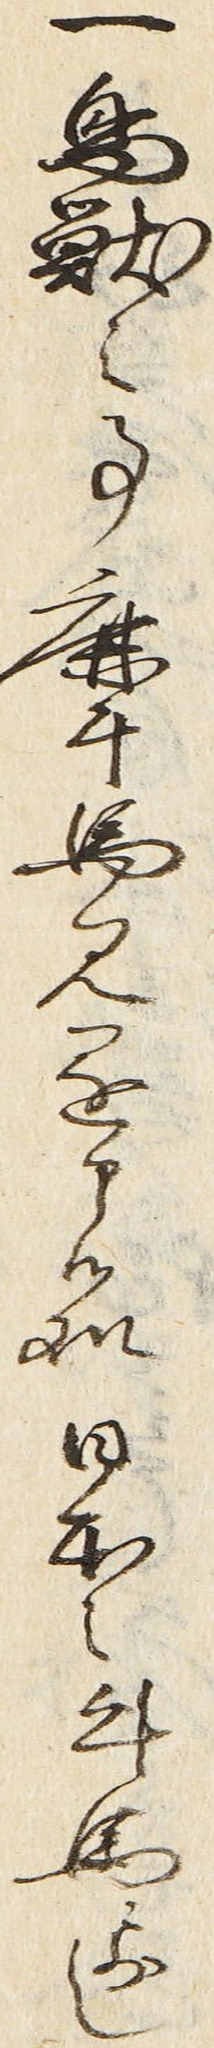一鳥獣之事鹿牛馬見懸申候処日本之牛馬に少し
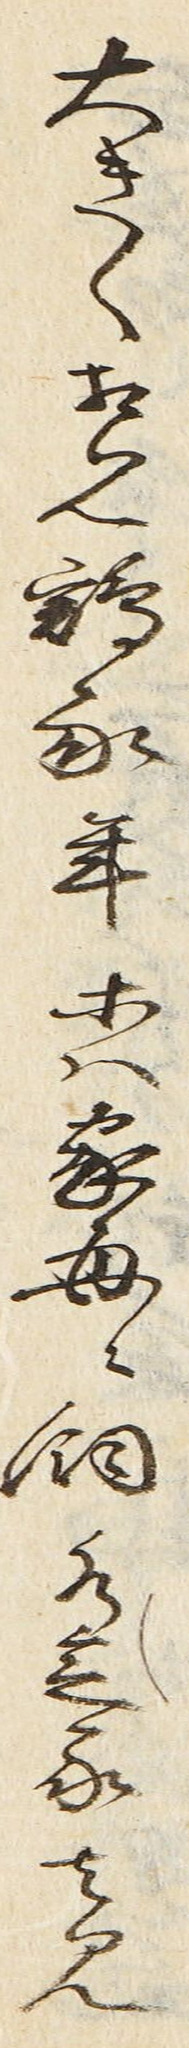大きく相見鶏豕羊等は家毎に飼水辺豕は見
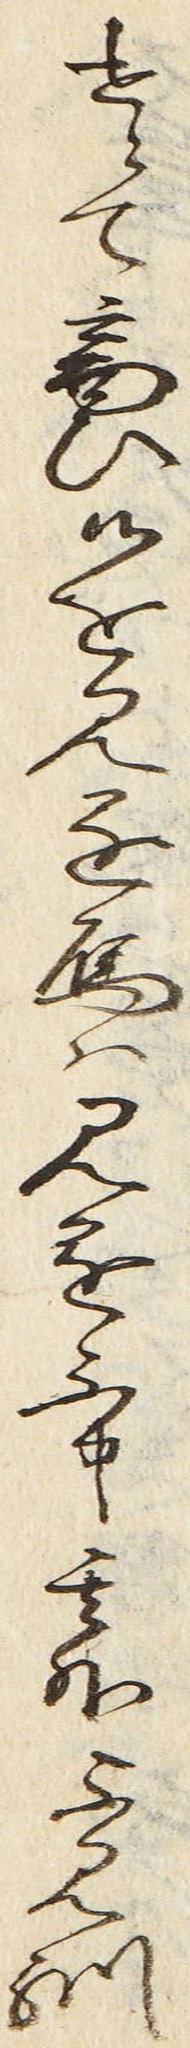世にて商ひ候を見懸鳫は見懸不申其外不見馴
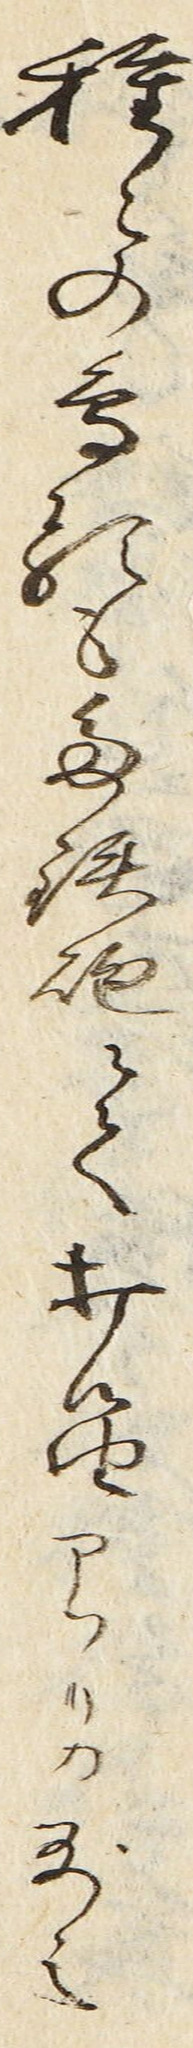種々の鳥類も多鉄砲にて打候由アフリカ州之
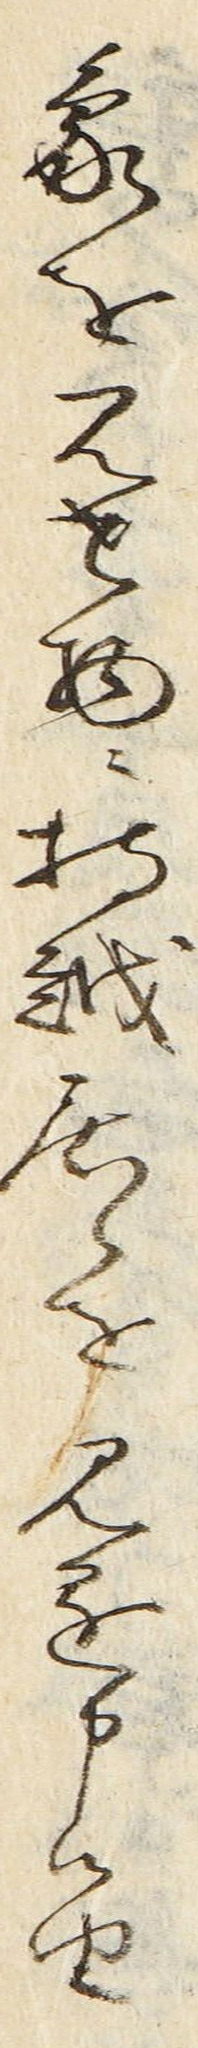象を見せ物に持越居候を見懸申候由

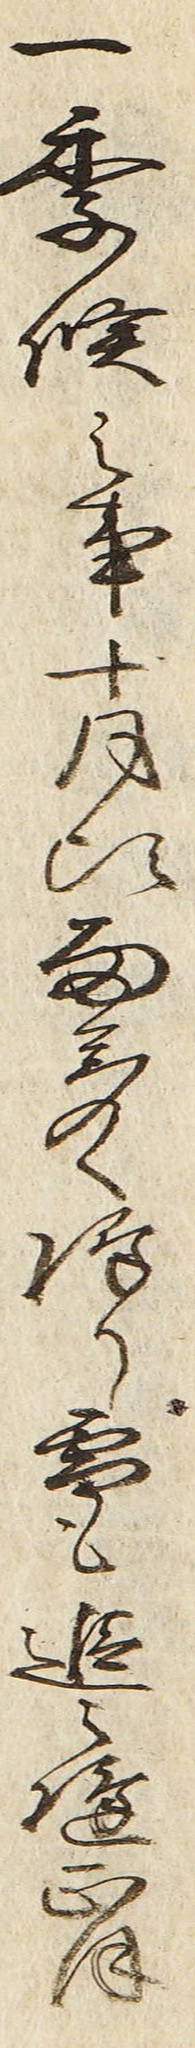一季候之事十月頃雨多く降り雪も追々降正月
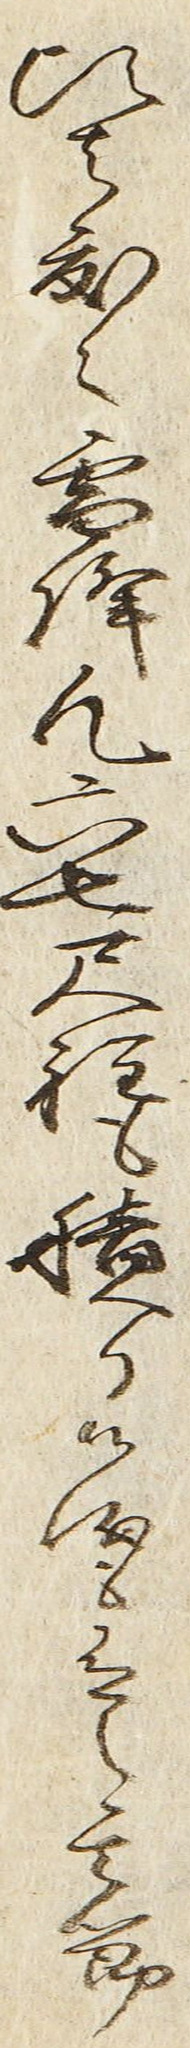頃は度々雪降凡六七尺程も積り候儀も有之其節
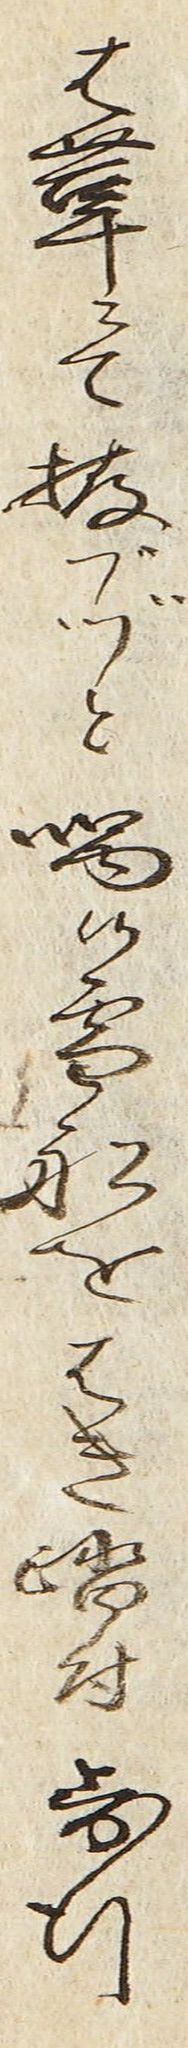は革にて拵ブツと唱候雪船をはき踏付歩行
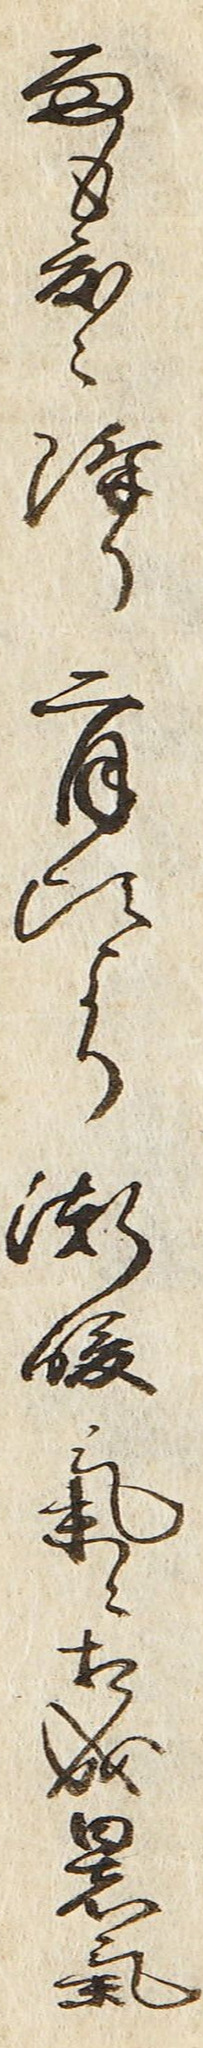雨も度々降り二月頃より漸暖気に相成暑気
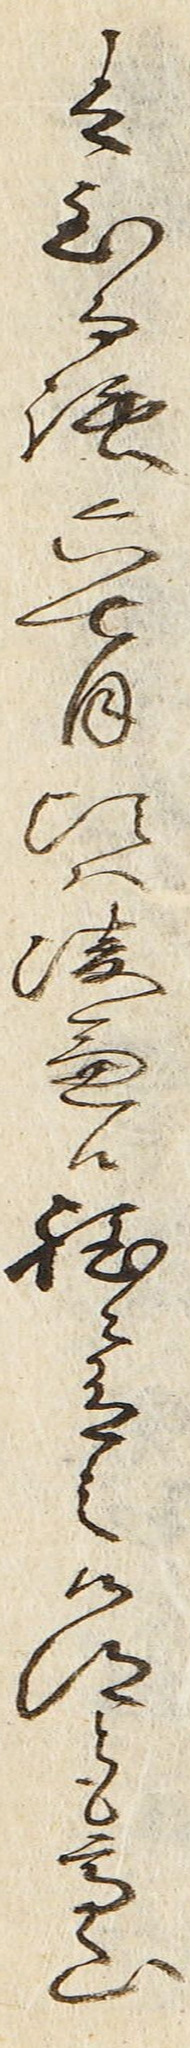は至而強六七月頃は凌兼候程に有之候得とも高山
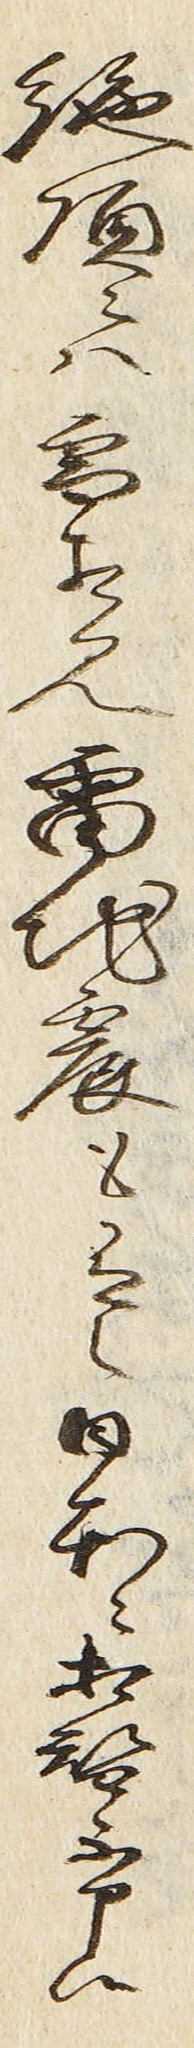絶頂には雪相見雷地震も有之日本に相替不申候
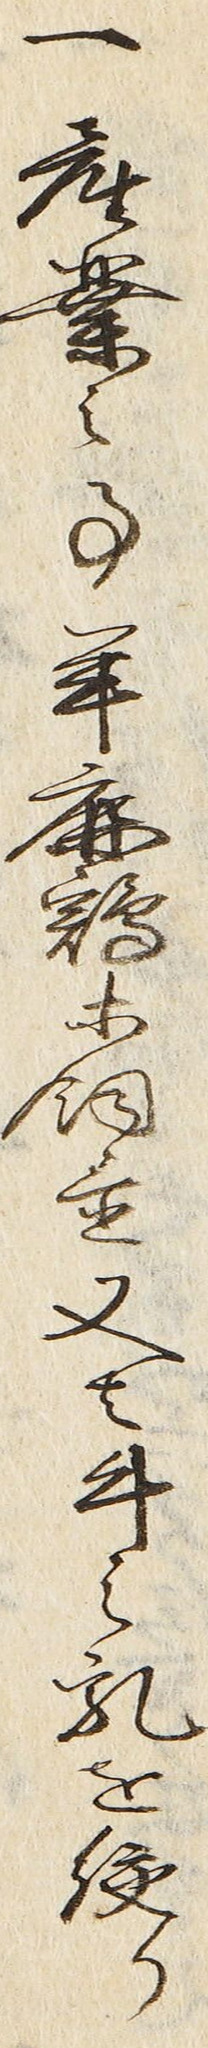一産業之事羊鹿鶏等飼置又は牛之乳を搾り
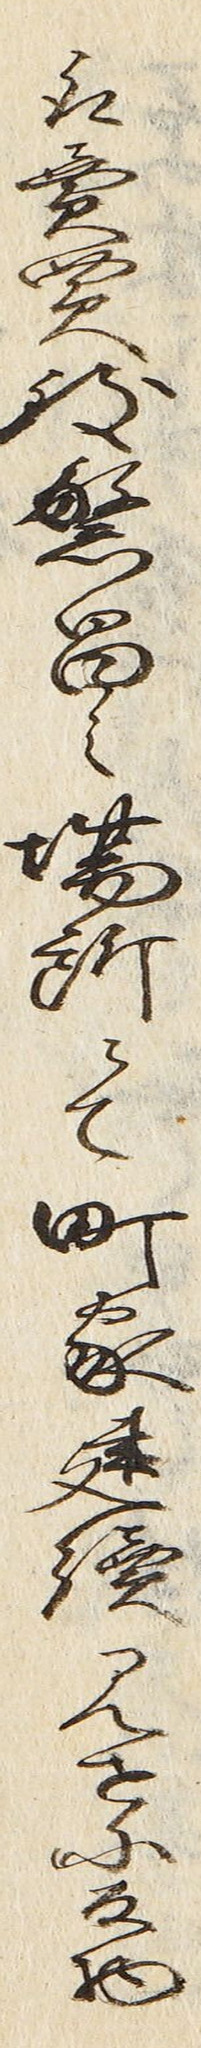取売買致繁昌之場所にて町家建続見世に反物
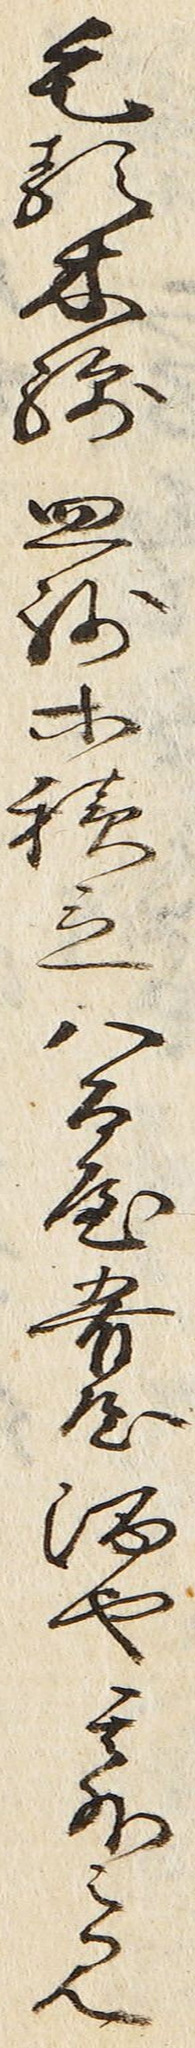毛類木綿皿紗等積立八百屋肴屋酒や其外之見
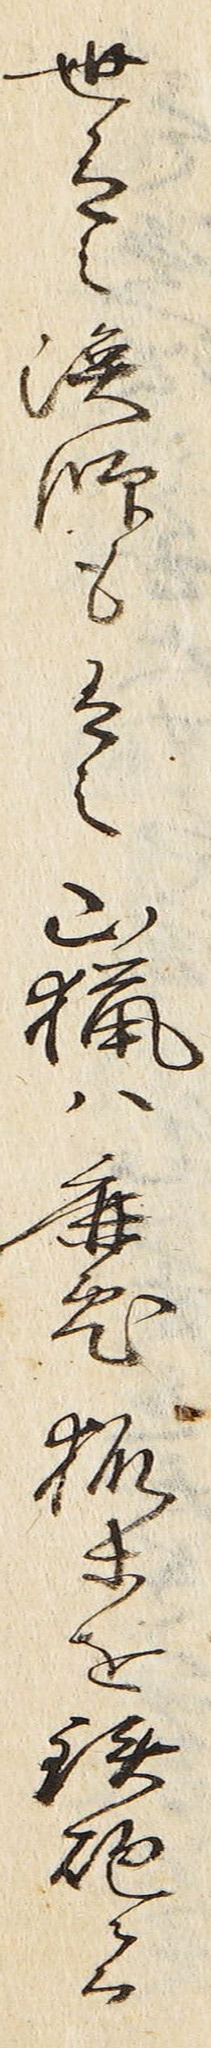世有之漁師も有之山猟は鹿兎狐等を鉄砲に而
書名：土佐中浜万次郎漂流記
